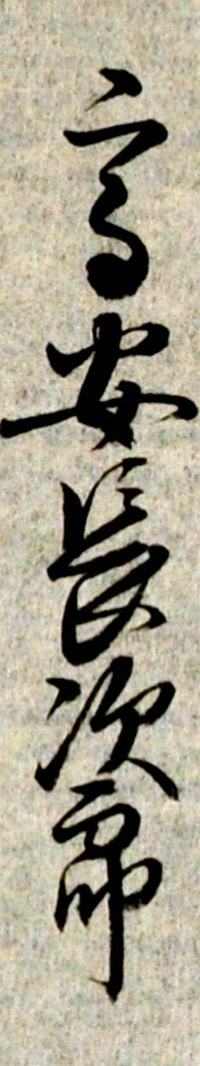高安長次郎
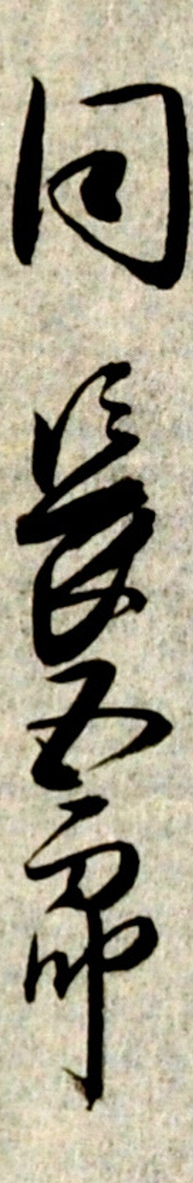同長五郎

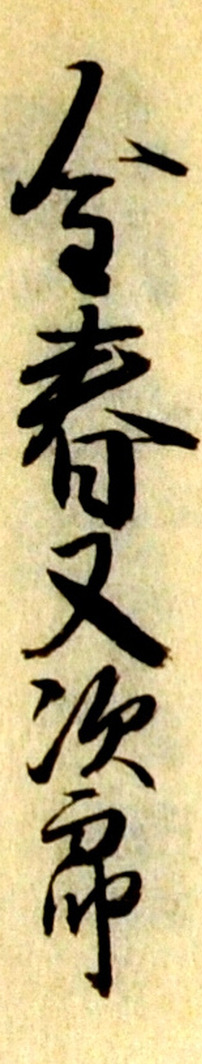金春又次郎
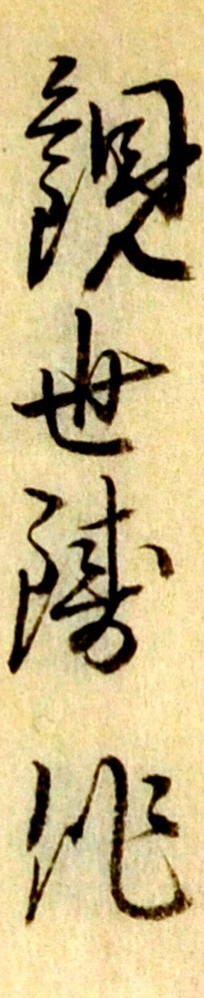観世銭作
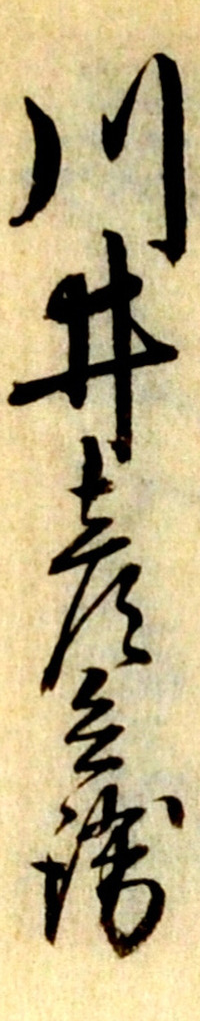川井彦兵衛
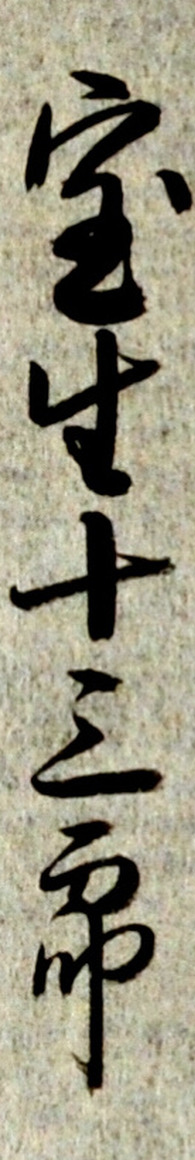宝生十三郎
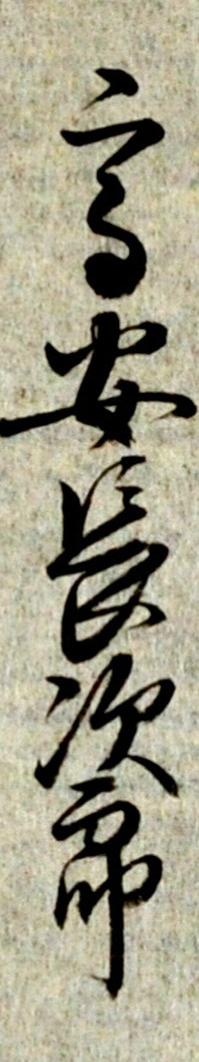高安長次郎
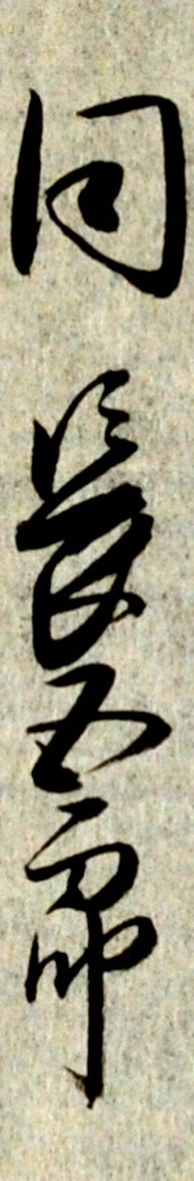同長五郎
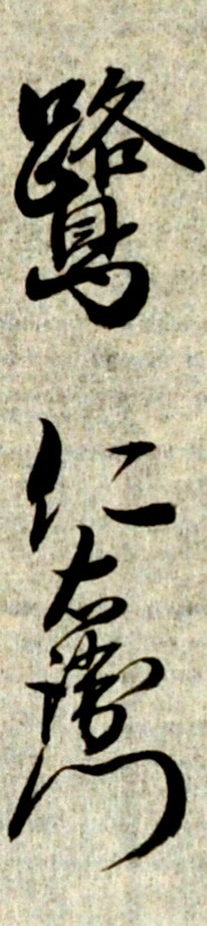鷺仁右衛門
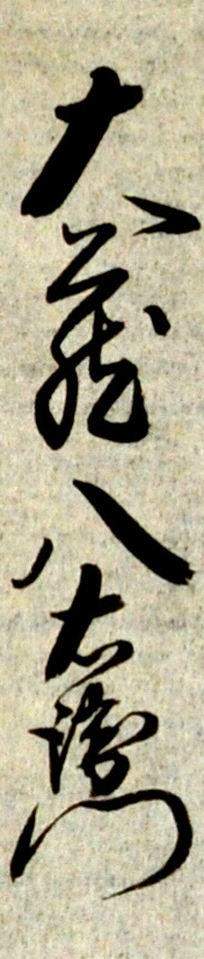大倉八右衛門
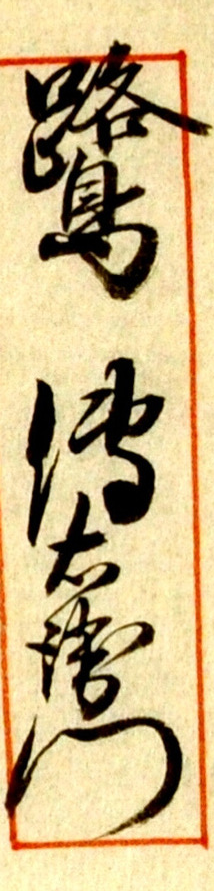鷺仁右衛門

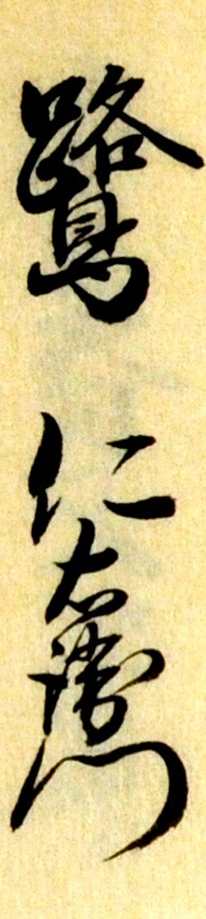鷺仁右衛門
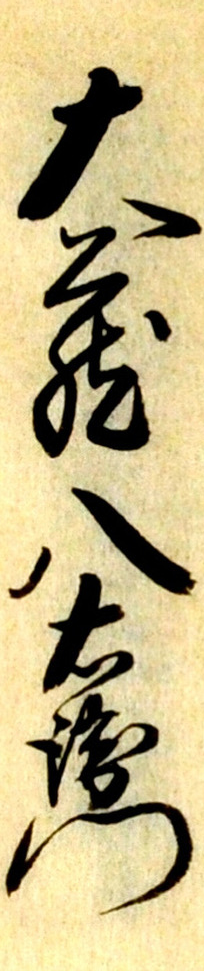大倉八右衛門

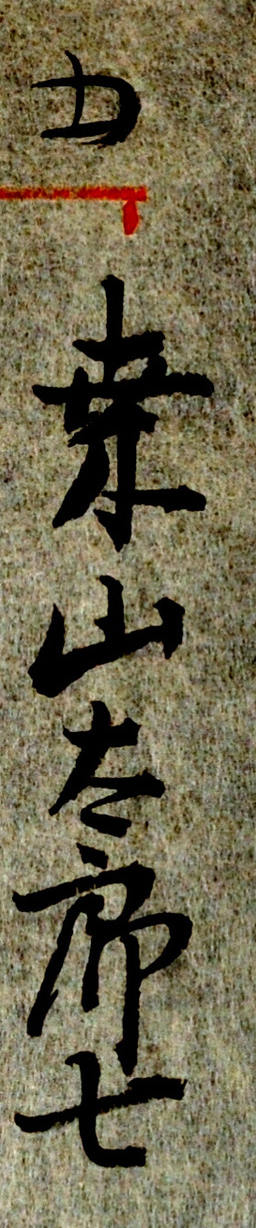五桑山太郎七
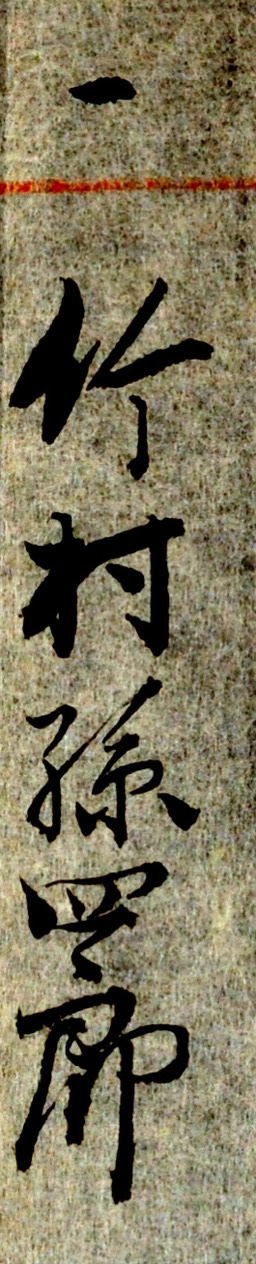一武村孫四郎
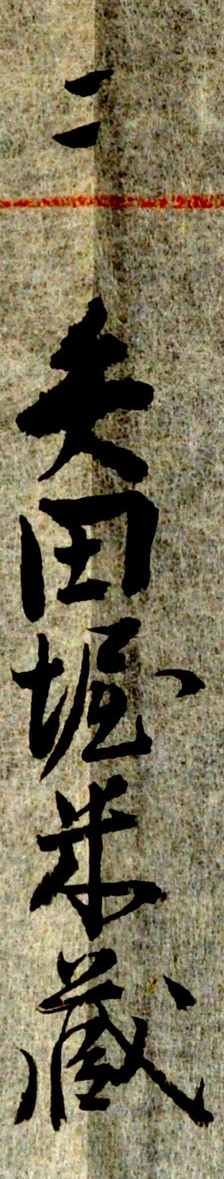二矢田堀米蔵
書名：若年寄御役中御調書付
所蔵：伊那市立高遠町図書館・合同会社AMANE
